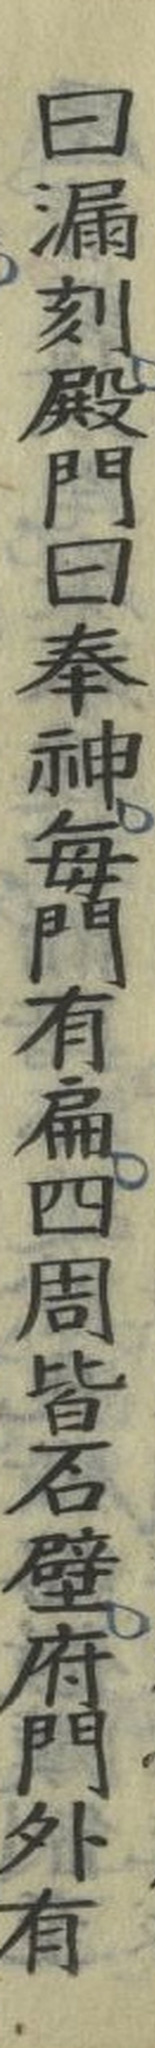曰漏刻。殿門曰奉神。每門有扁。四周皆石壁。府門外有
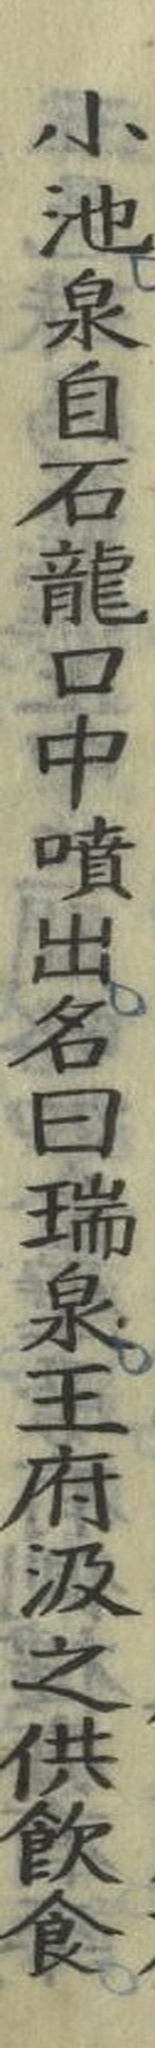小池。泉自石龍口中噴出。名曰瑞泉。王府汲之供飮
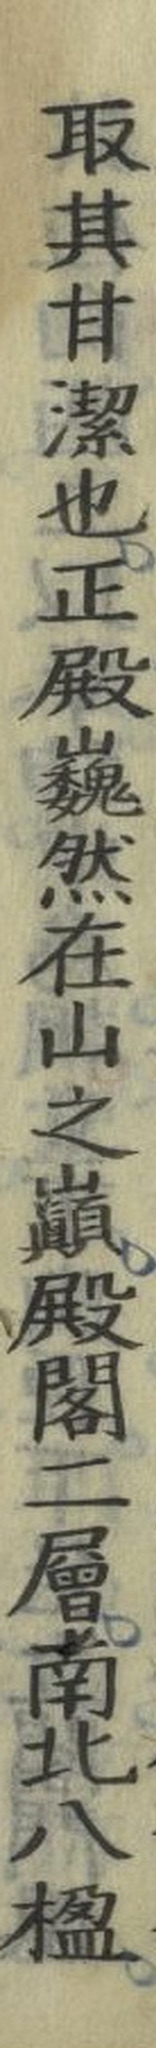取其甘潔也。正殿巍然在山之巓。殿閣二層。南北八楹。

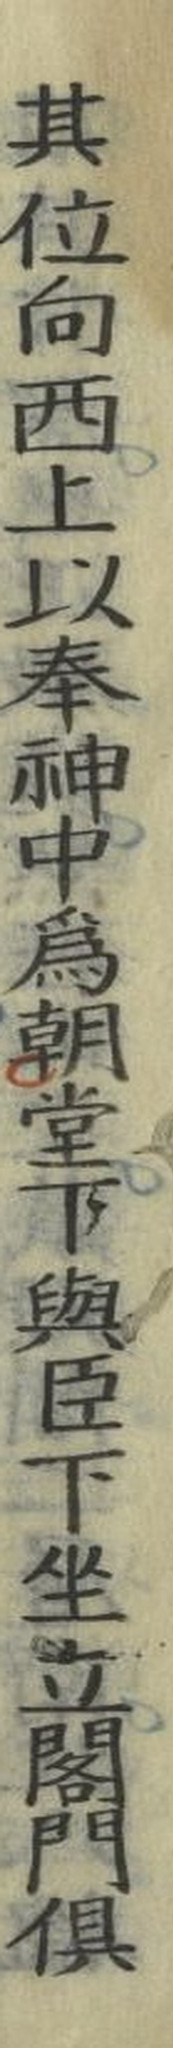其位向西。上以奉神中爲朝堂。下與臣下坐立。閣門
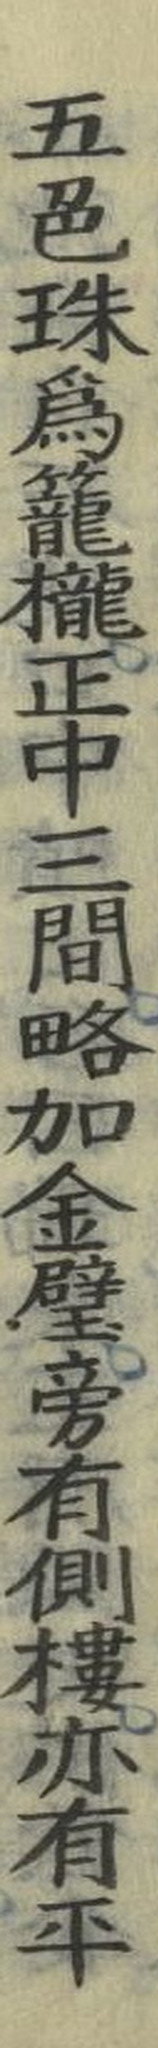五色珠爲籠櫳。正中三間。略加金璧。旁有側樓。亦有平
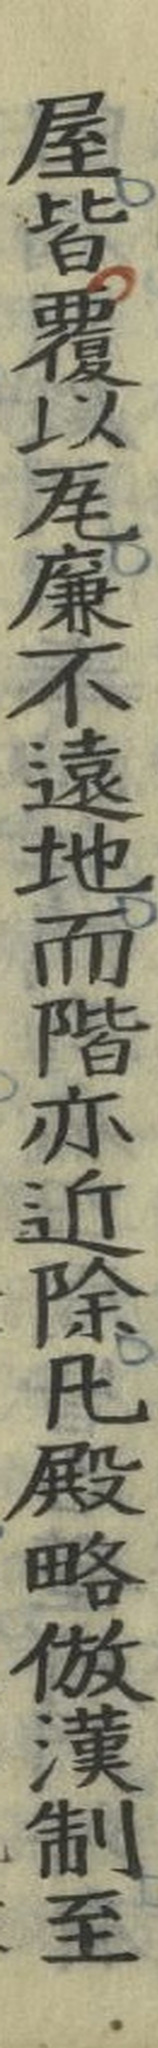屋。皆覆以瓦。廉不遠地。而階亦近除。凡殿略倣漢
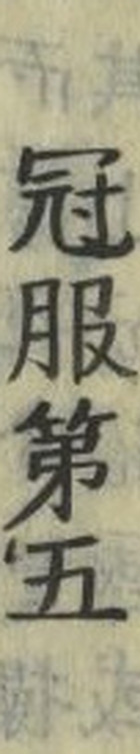冠服第五
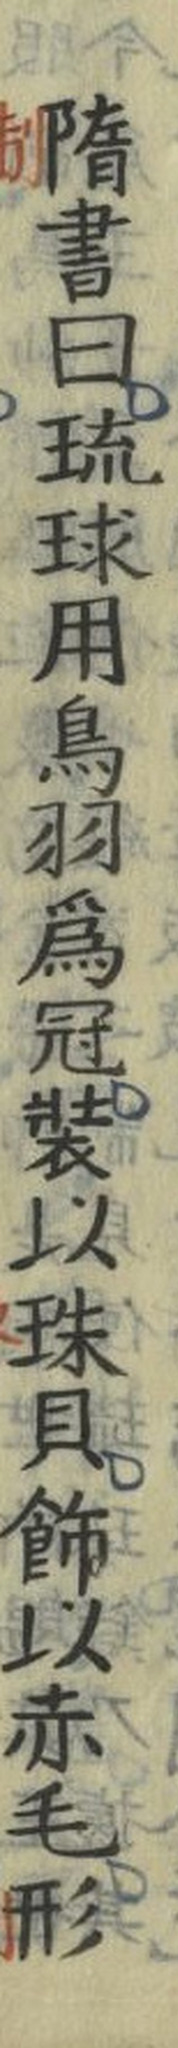隋書曰。琉球用鳥羽爲冠。裝以珠貝。飾以赤毛。形
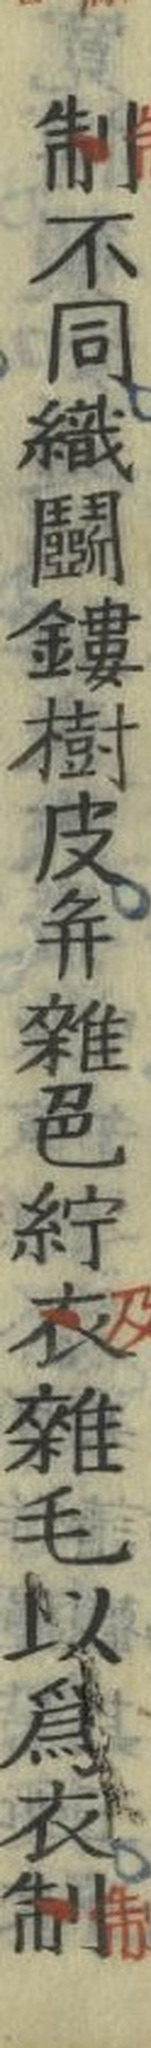制不同。織鬭鏤樹皮。并雜色紵衣及雜毛以爲衣。制
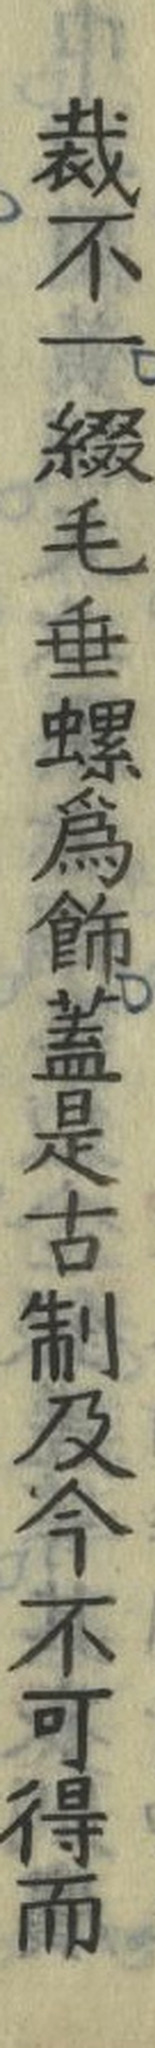裁不一。綴毛垂螺爲飾。蓋是古制及今不可得而
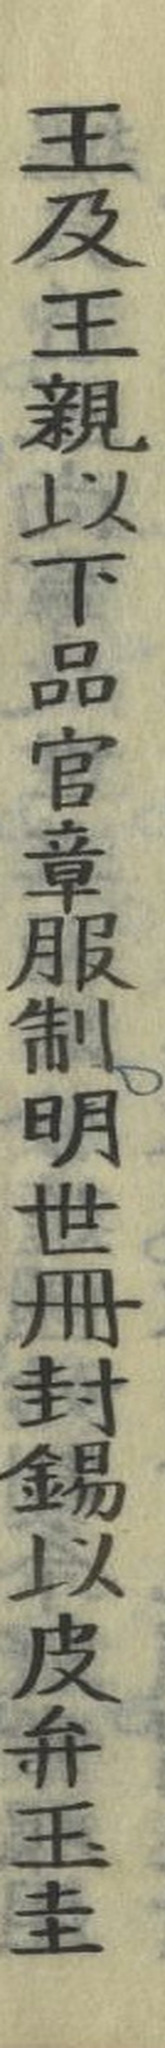王及王親以下品官章服制。明世冊封錫以皮弁玉圭
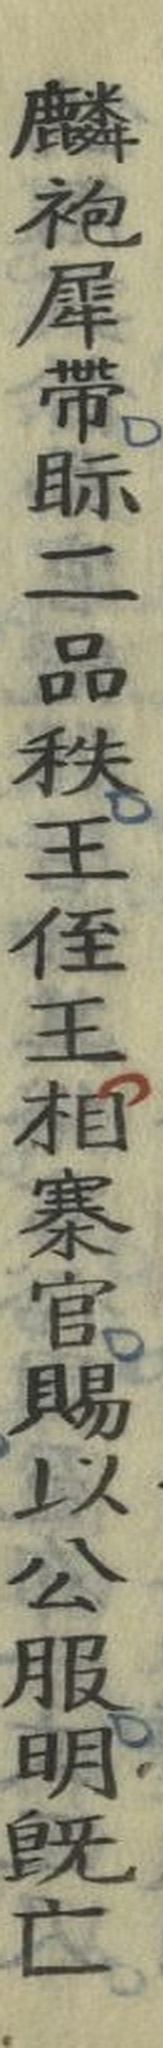麟袍犀帯。眎二品秩。王侄相寨官。賜以公服。明
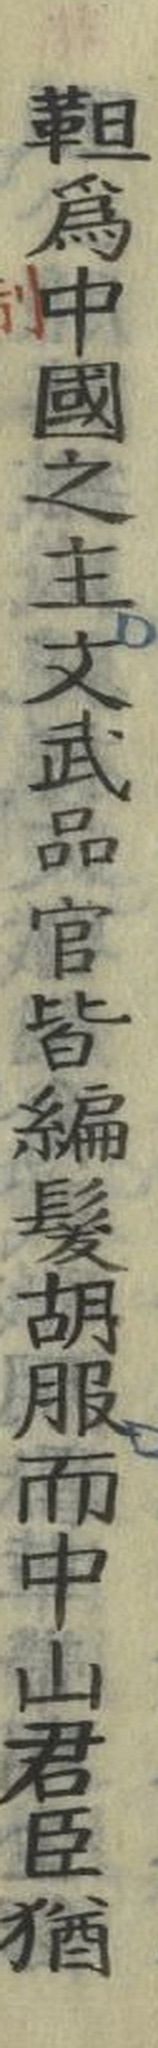靼爲中國之主。文武品官皆編髪胡服。而中山君臣
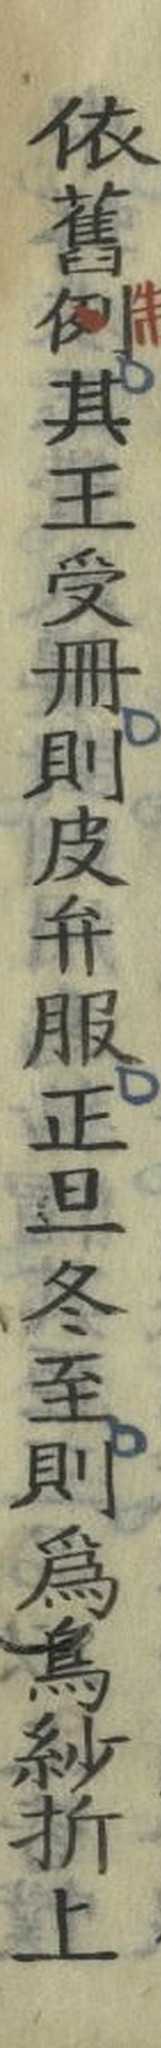依舊例制。其王受冊。則皮弁服。正旦冬至。則爲鳥紗折上

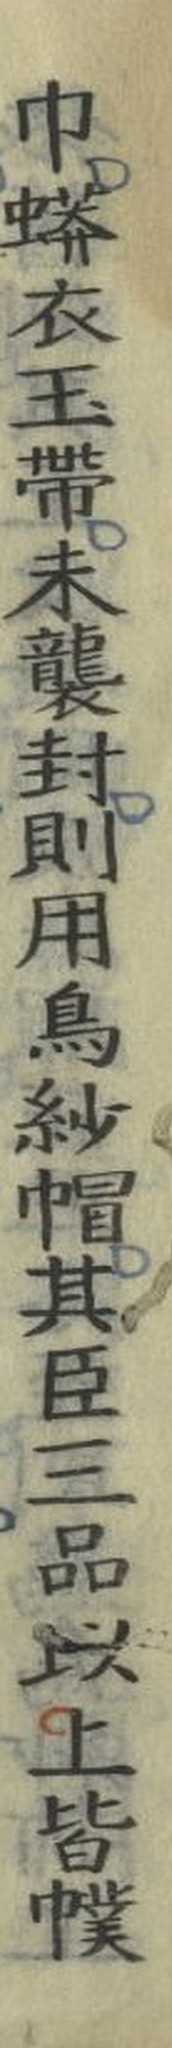巾。蟒衣玉帶。未襲封。則用鳥紗帽。其臣三品以上皆幞
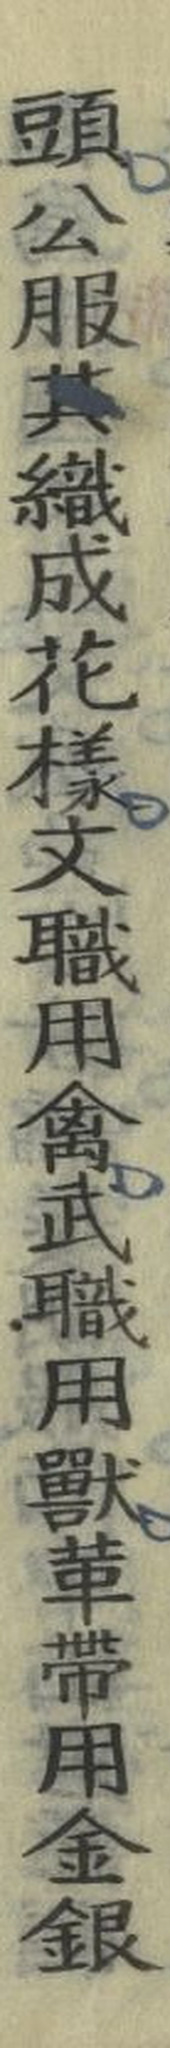頭。公服其織成花樣。文職用禽。武職用獸。革帶用金銀
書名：南島志
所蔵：University of the Ryukyus Library
